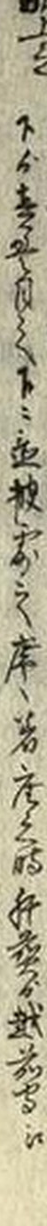下ゟ壱畳目之下ニ置披露之席へ着座之時肝煎ゟ越前守江
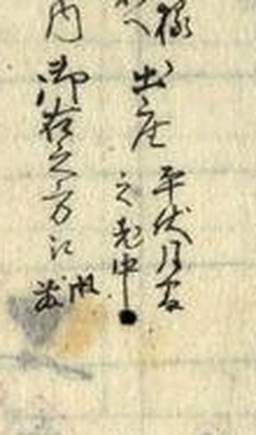之老中
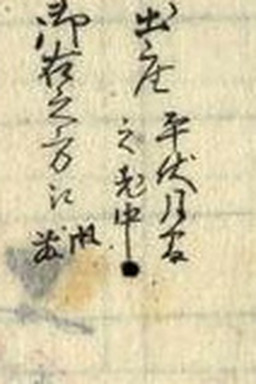之老中
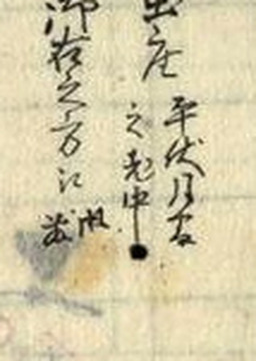之老中
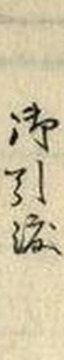御引渡
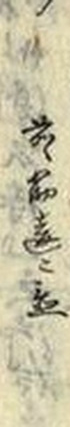前へ筋違ニ置

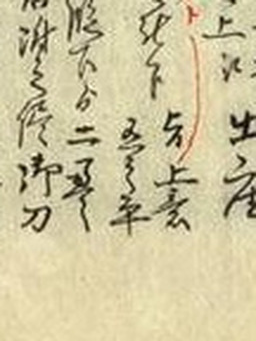有之平
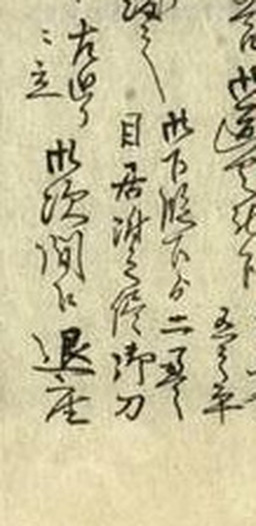目居附之儘御刀
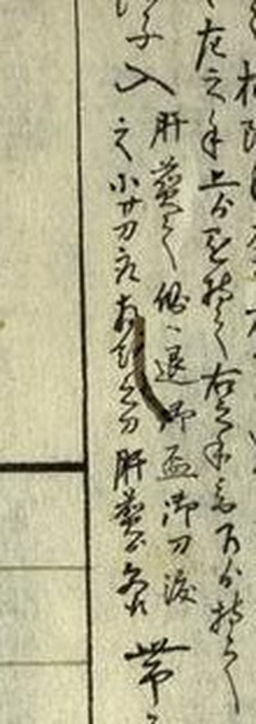之小サ刀取拝領之刀肝煎ゟ受取帯之
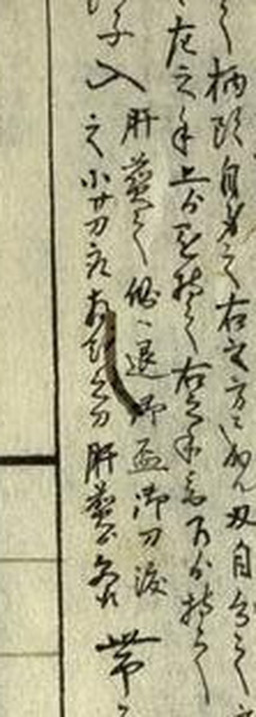之小サ刀取拝領之刀肝煎ゟ受取帯之
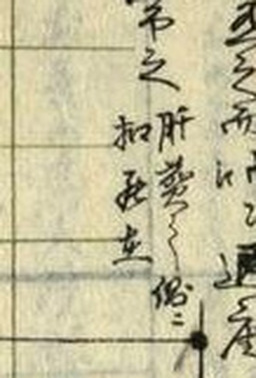控罷在

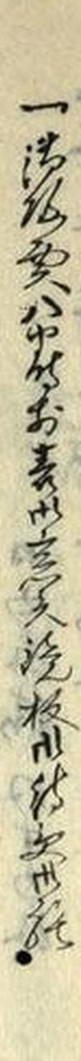一御帰殿八半時前表御玄関鏡板御待受御旗
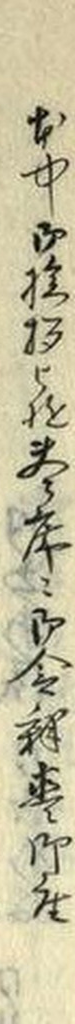本中御挨拶被遊夫々席ニ御会釈直ニ御座
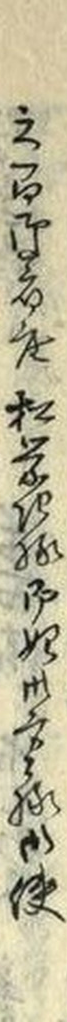之間御着座松栄院様御始此方々様御使
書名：少傅日録抄（斉善付側向頭取日記、在府）
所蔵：福井県文書館 Fukui Prefectural Archives
